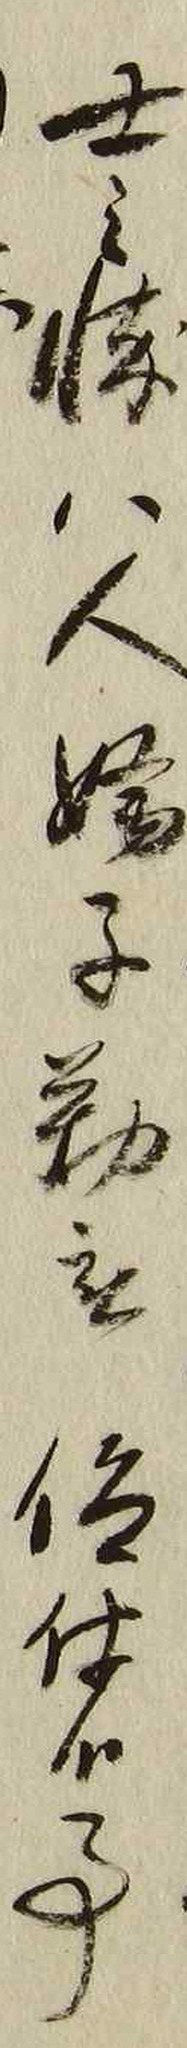士之忰八人嫡子勤被仰付候事
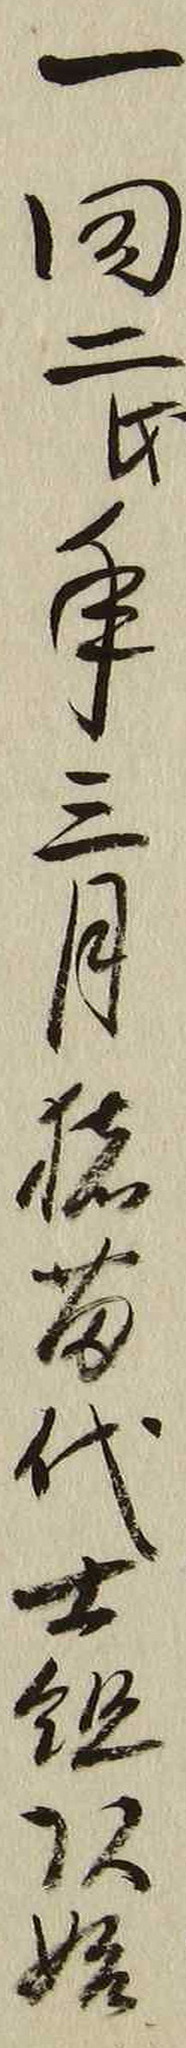一同二戌年三月猪苗代士組頭始
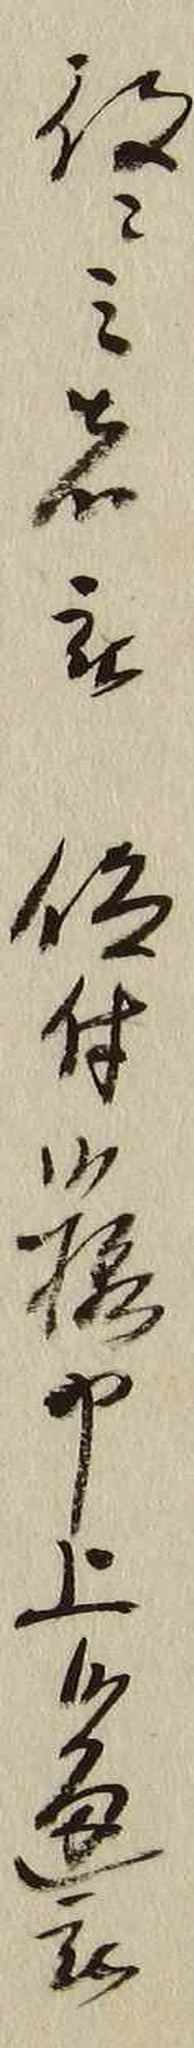役々之者被仰付候様申上候通被
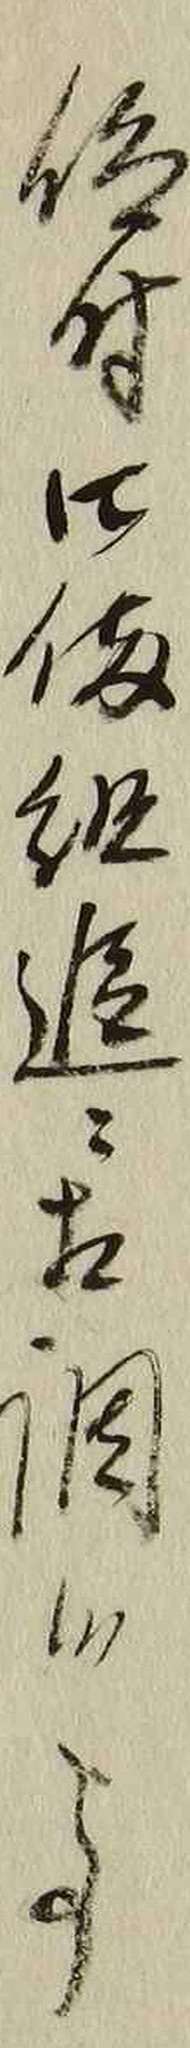仰付御備組追々相調候事
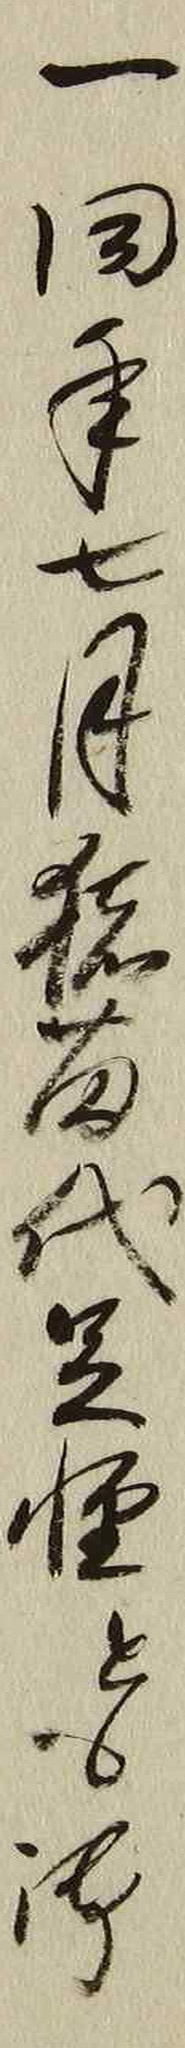一同年七月猪苗代足軽とも御
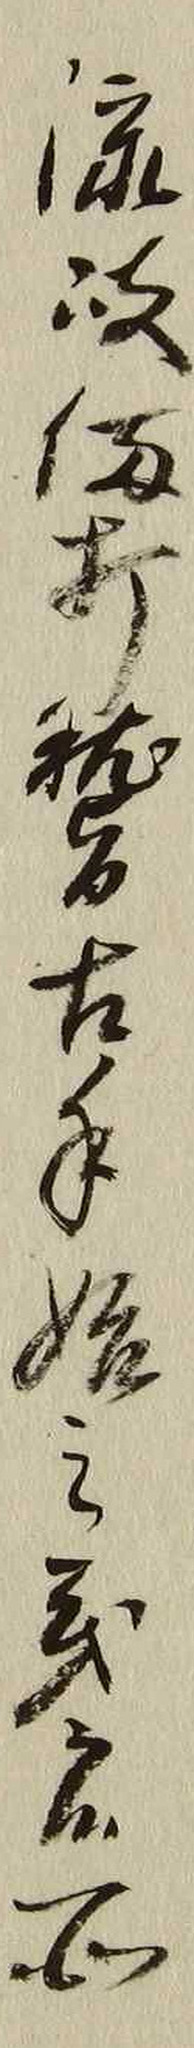流岐備打稽古手始之義ニ候所
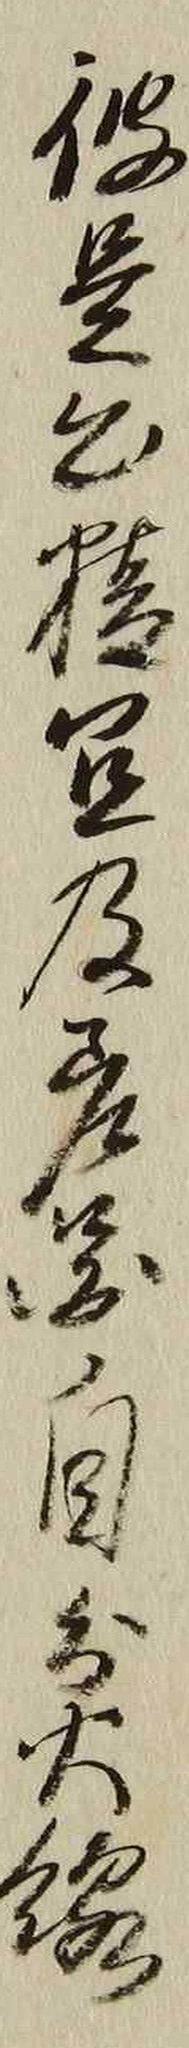彼是出精宜及差図自分火線
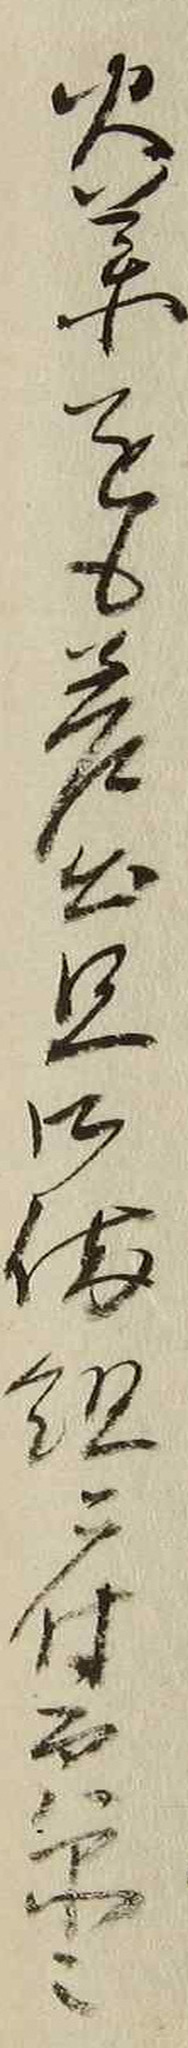火薬をも差出且御備組ニ付而ハ品々
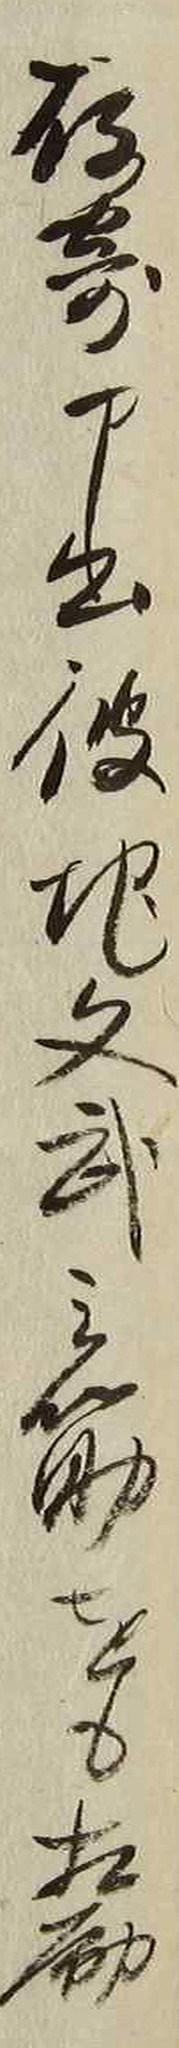存寄申書彼地文武之筋をも相励
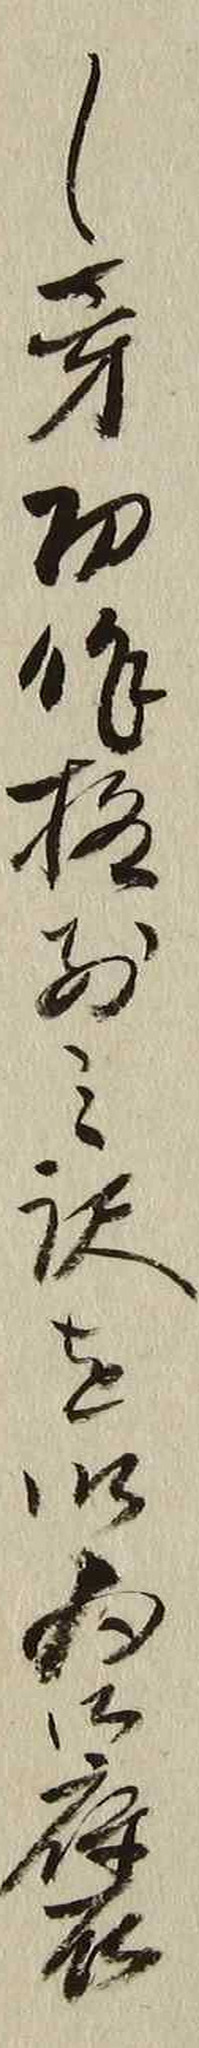し旁功作格別之訳を以為御褒
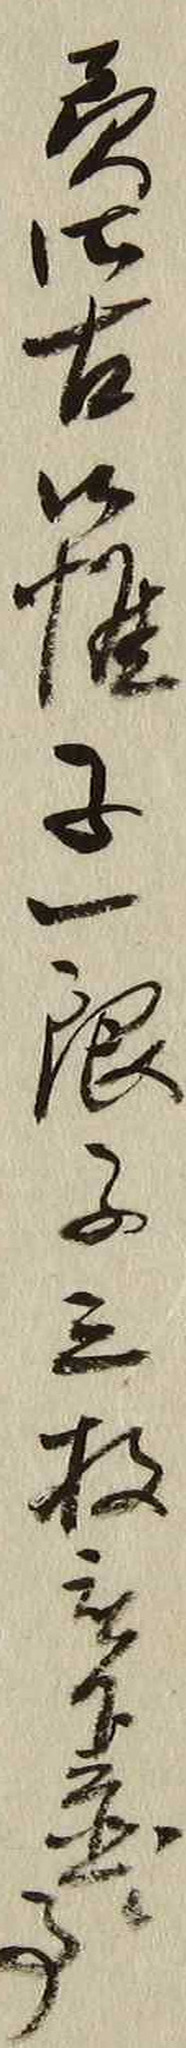美御古御帷子一銀子三枚被下置候事
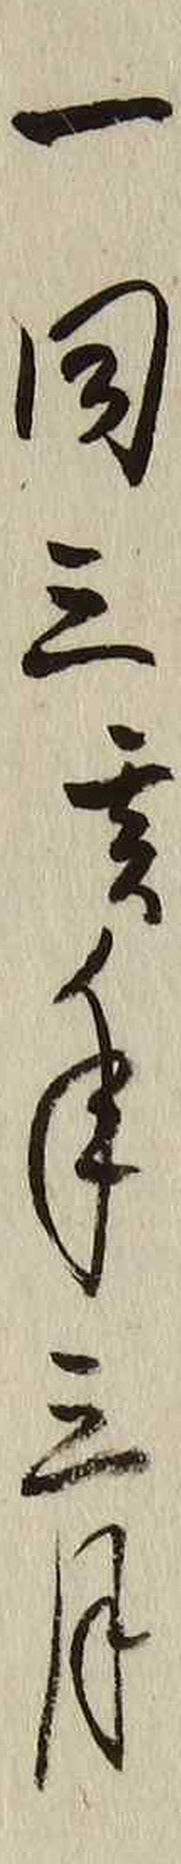一同三亥年三月
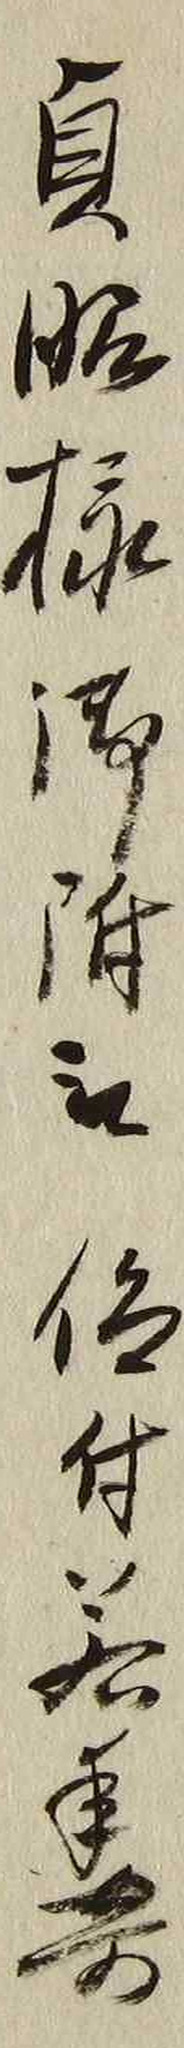貞昭様御附被仰付若年寄
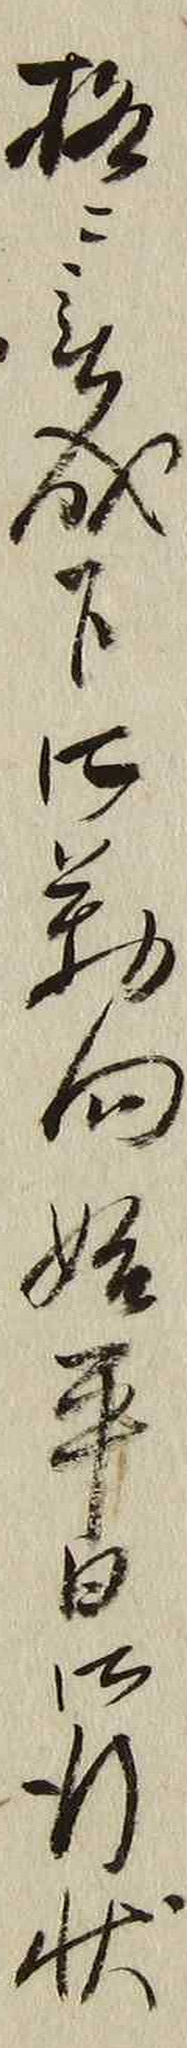格ニ被成下御勤向始平日御行状
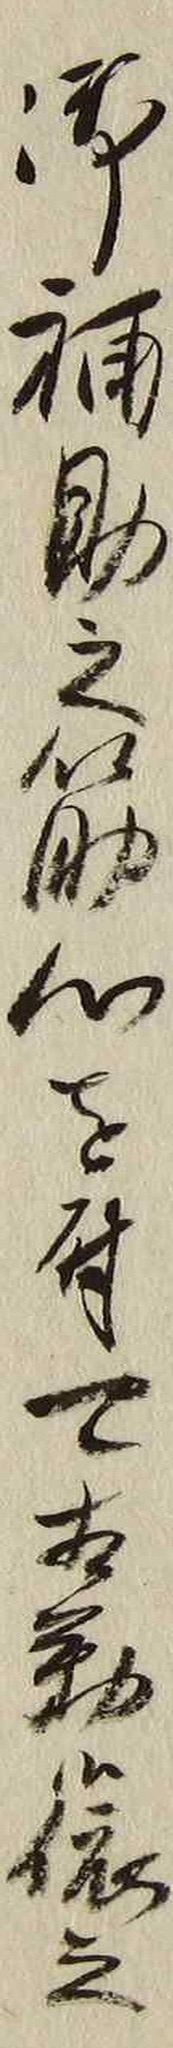御補助之筋以心を付可相勤依之
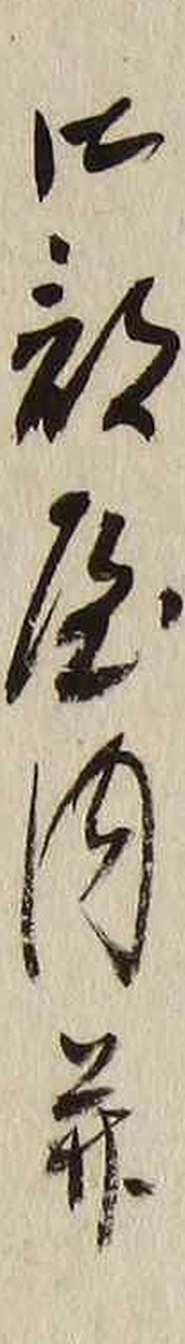御部屋内并
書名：諸士系譜　巻之351　す之部1
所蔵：会津若松市立会津図書館
